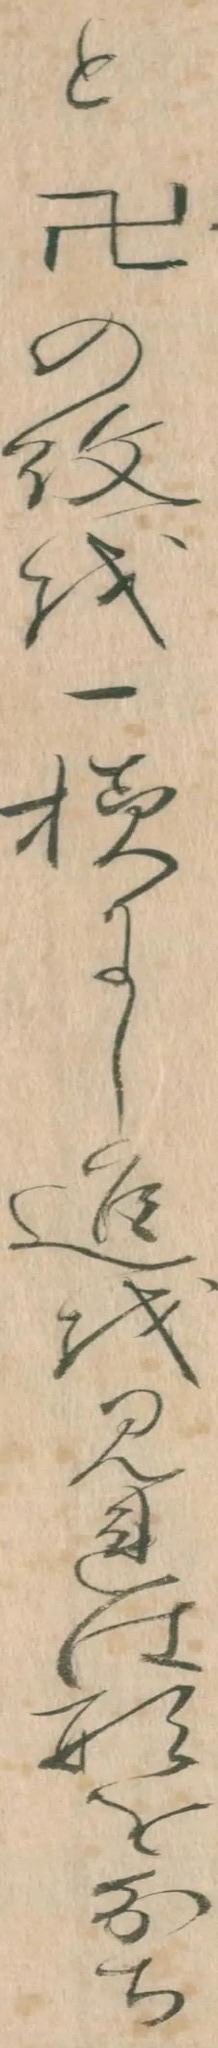と卍の紋を一様にし近をみれは形を分ち
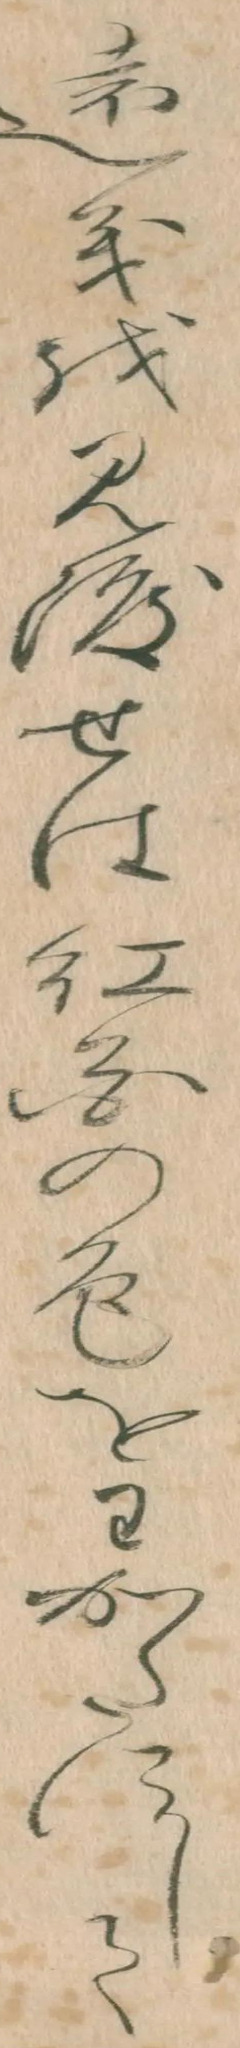遠きを見渡せは紅白の色をわかたすして
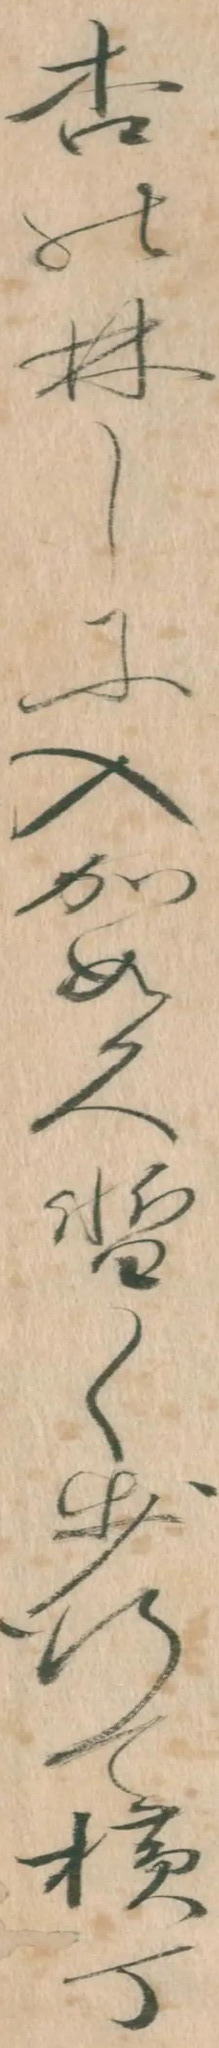杏の林しに入か如く暫く歩行て横丁
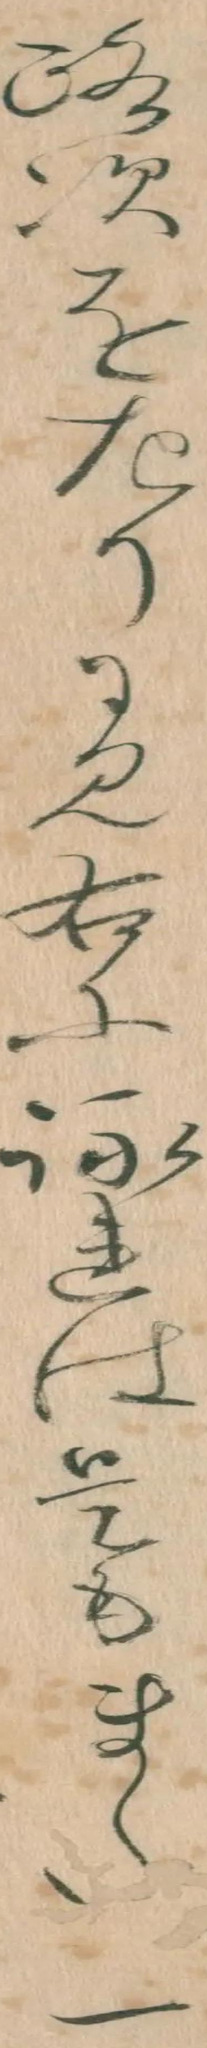路次を左りに見右に詠れは是もまた一
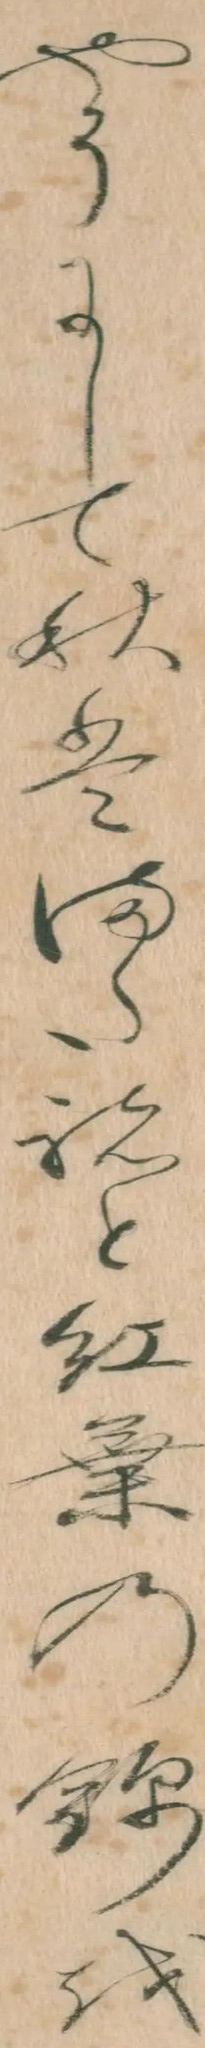やうにして秋はまた跡と紅葉の錦を
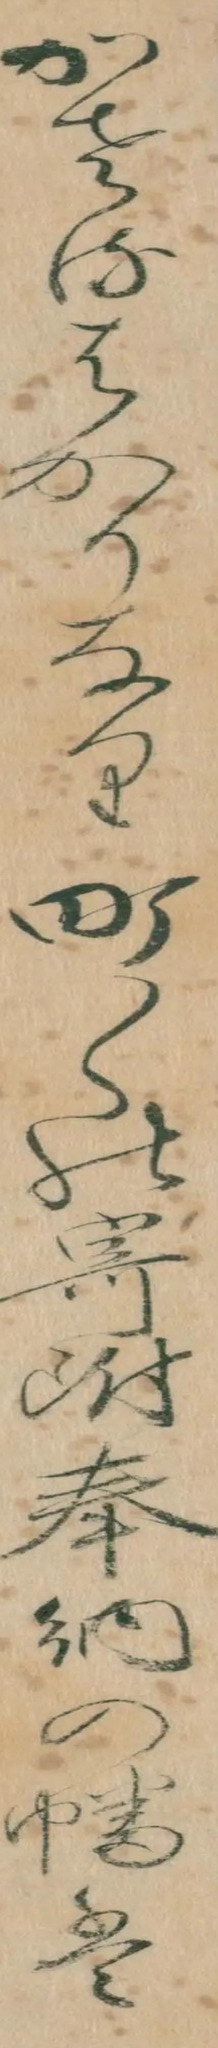かさるはかりなり町〳〵の寄附奉納の幡は
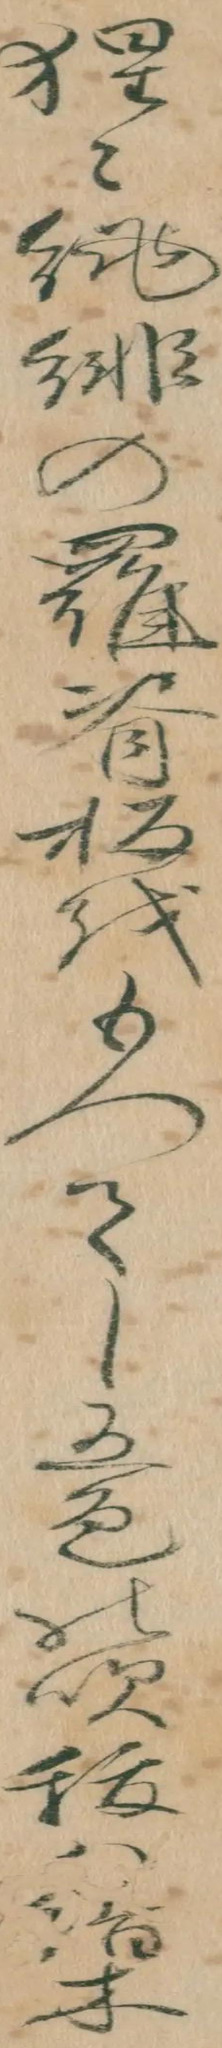猩々緋緋の羅脊板をもつてし五色の吹抜は絹木
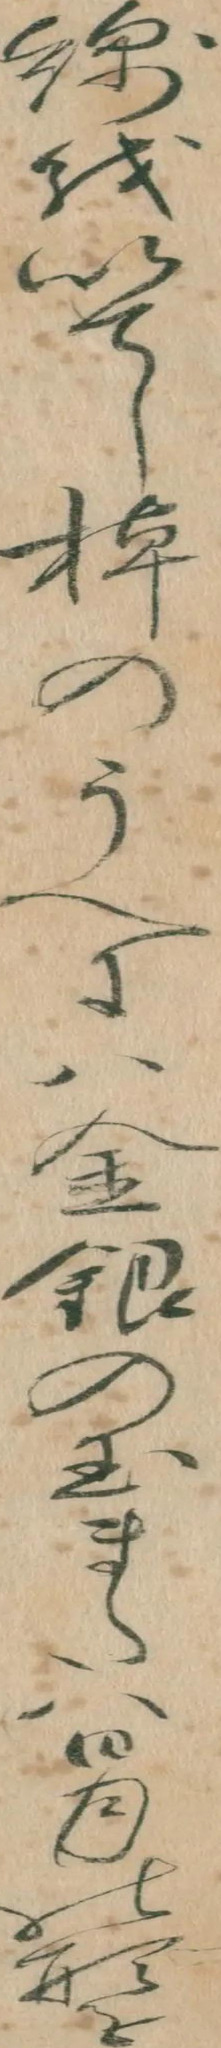綿を以てし棹のうへには金銀の玉または日月の形を
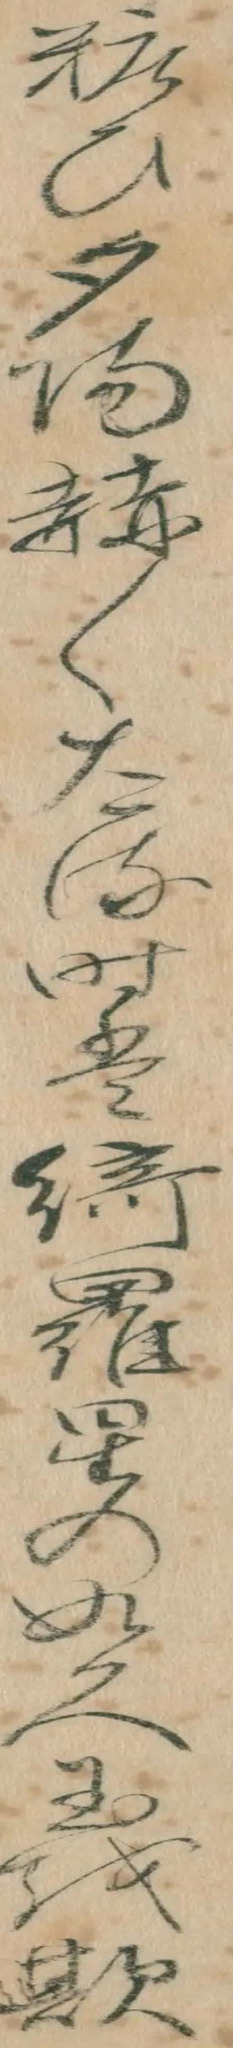粧ひ夕陽赫〳〵たる時は綺羅星の如く玉を欺
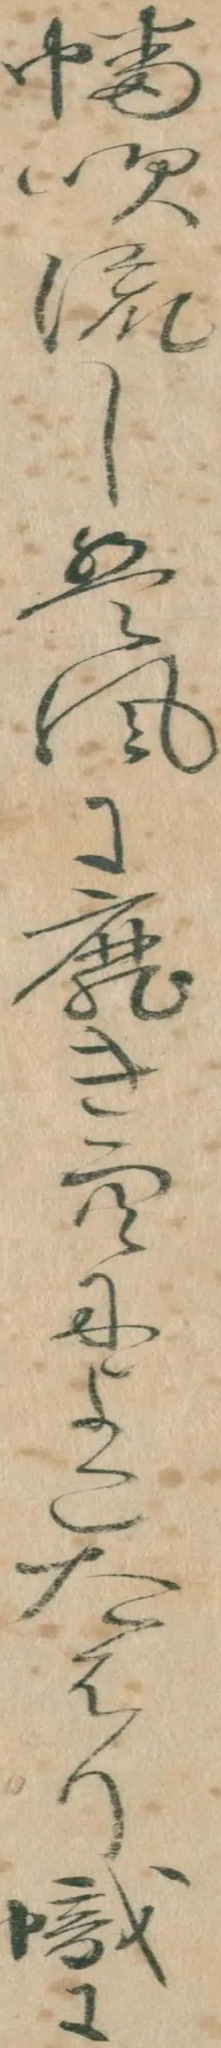幡吹流しは風に靡き空によこたはり幟に
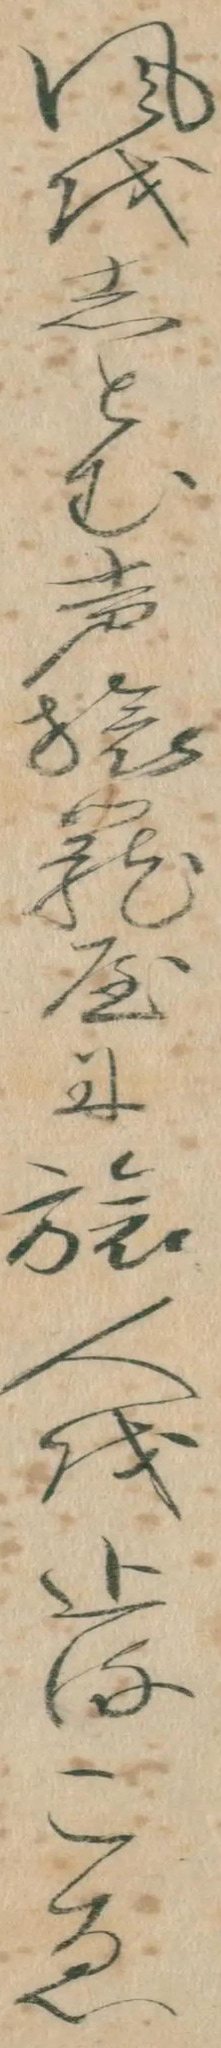風をしとむ声旅籠屋に旅人を止るこゑ
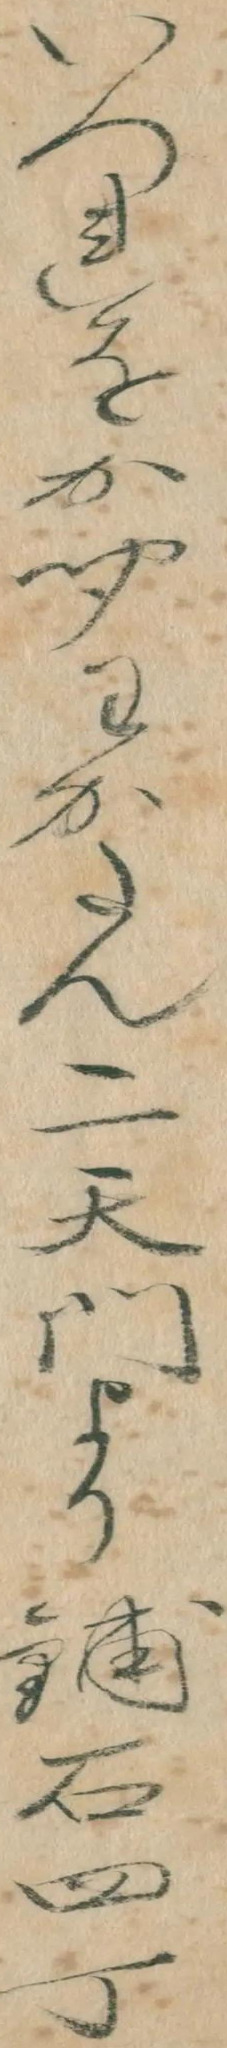いつれをか聞わかたん二天門より鋪石四丁
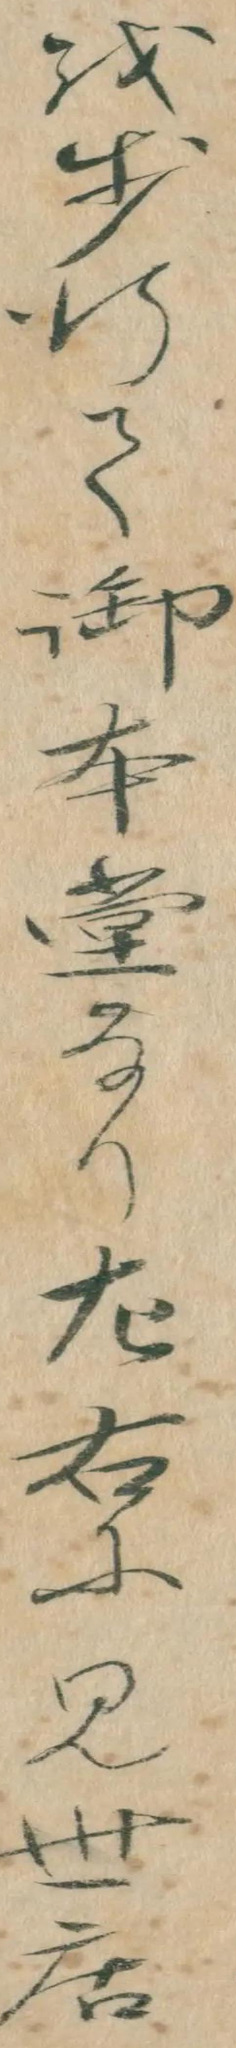を歩行て御本堂なり左右に見世店
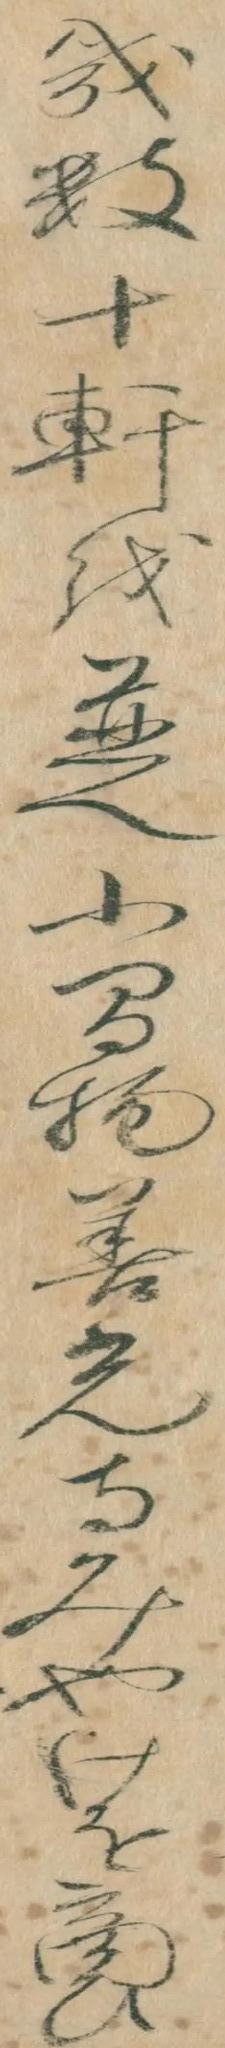幾数十軒を並へ小間物善光寺みやけを商ひ
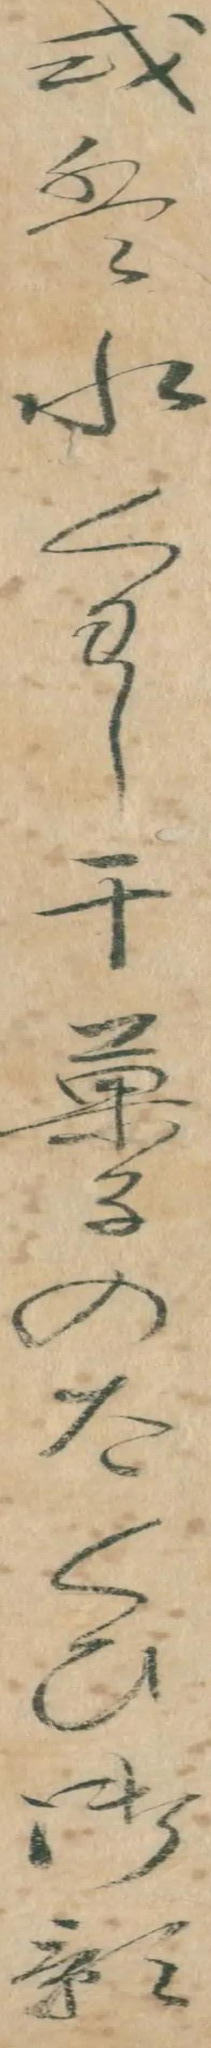或は水くわし干菓子のたくひ御影

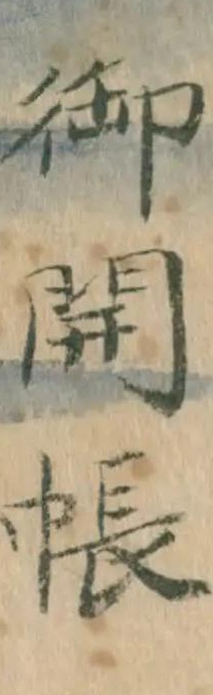御開帳
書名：俗語之種. [2]
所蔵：国立国会図書館 National Diet Library, JAPAN
